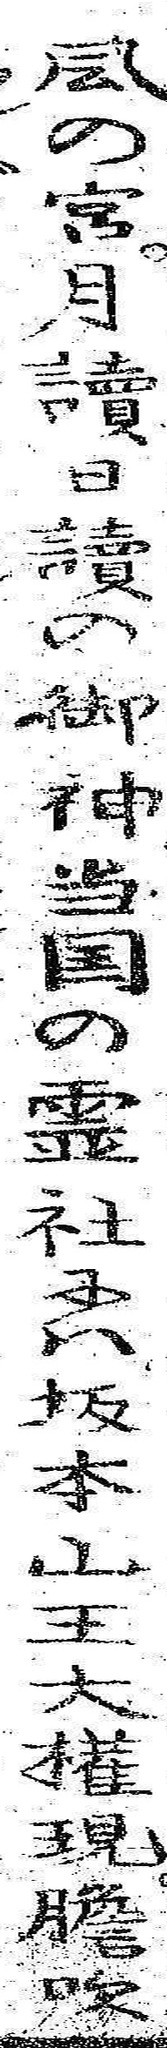風の宮。月読日読の御神。当国の霊社には。坂本山王大権現。胆吹
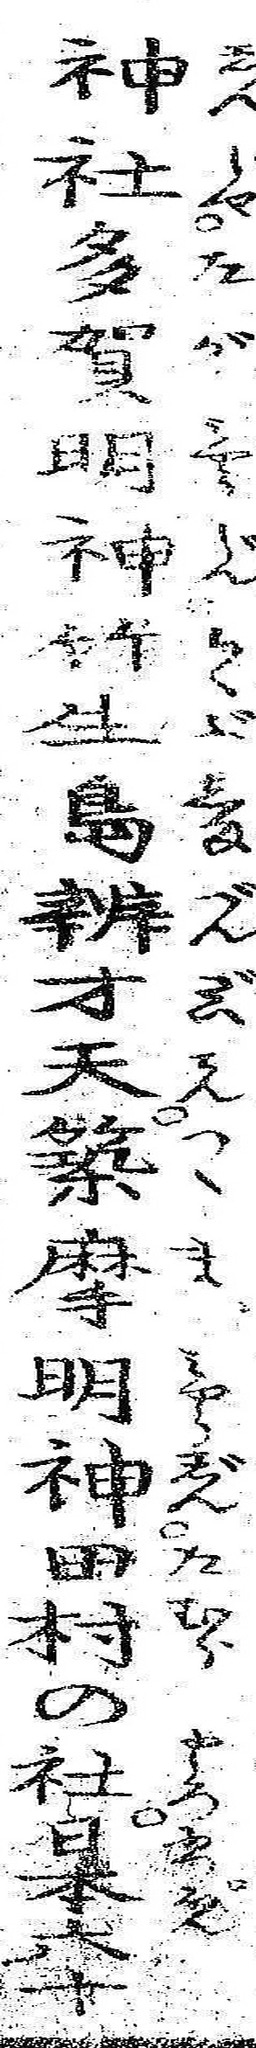神社。多賀明神。竹生島弁才天。築摩明神。田村の社。日本六十

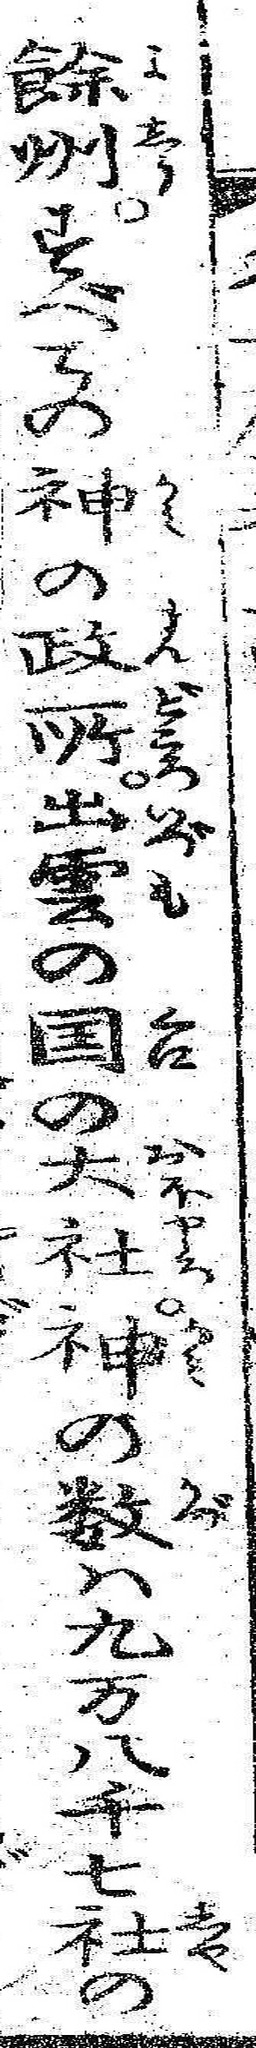余州。すべての神の政所。出雲の国の大社。神の数は九万八千七社の
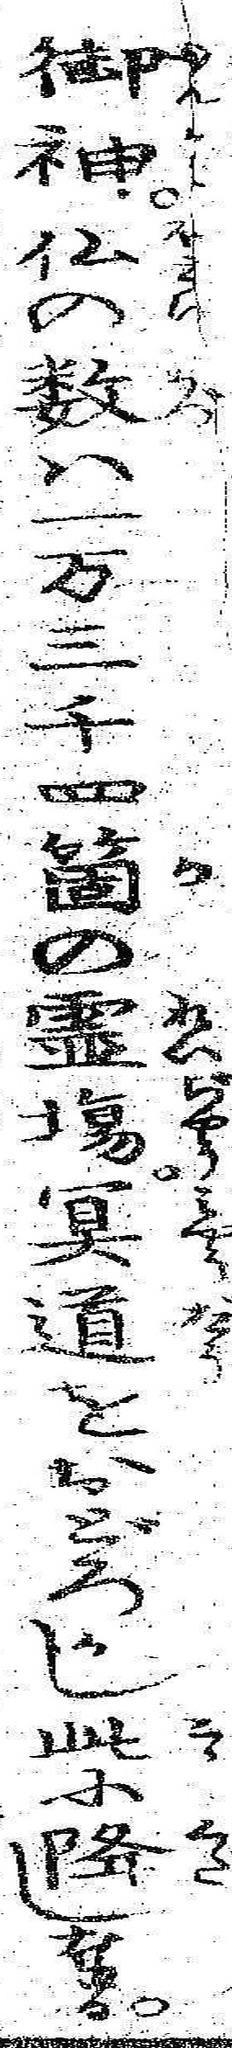御神。仏の数は一万三千四箇の霊場。冥道をおどろかし此に降し奉る。
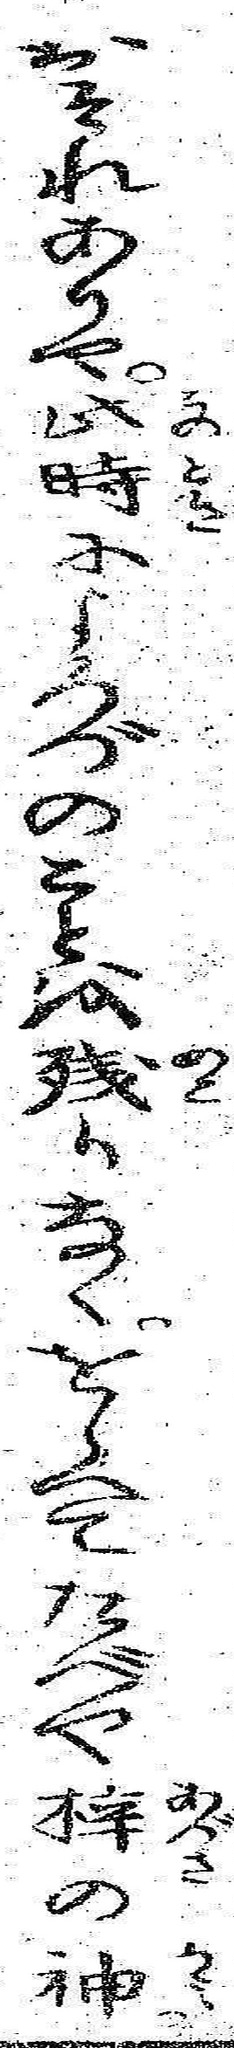おそれありや。此時によろづのことを残りなく。をしへてたべや梓の神。
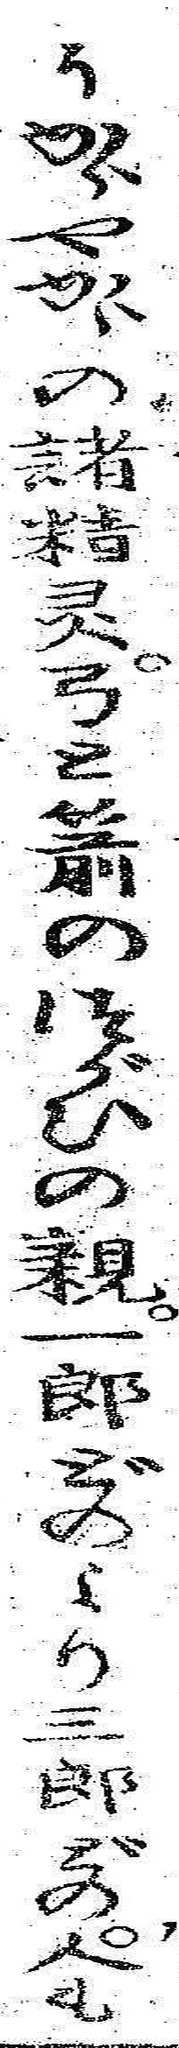うからやからの諸精霊。弓と箭のつがひの親。一郎どのより三郎どの。人も
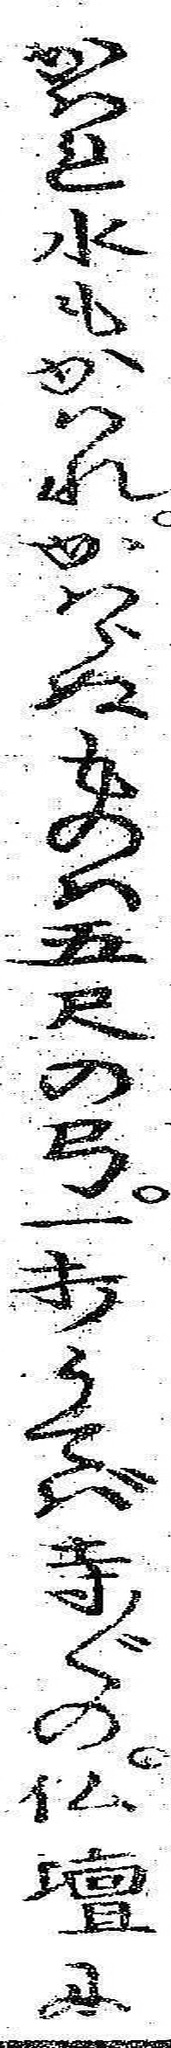かはれ水もかはれ。かはらぬものは五尺の弓。一打うてば寺〴〵の。仏壇に
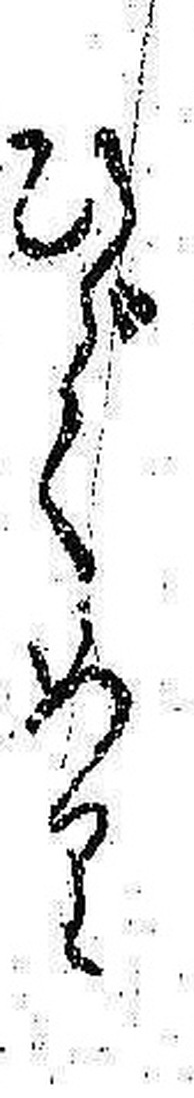ひゞくめり
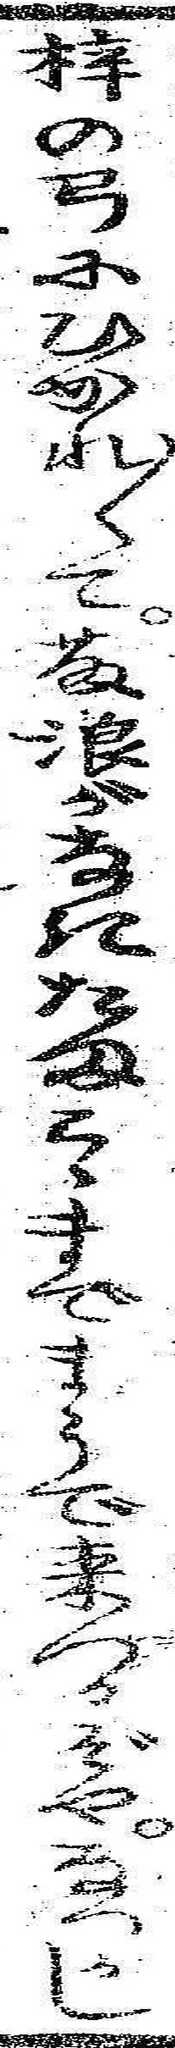梓の弓にひかれ〳〵て。藤娘がなきたまこゝまでまうで来つるぞや。なつかし
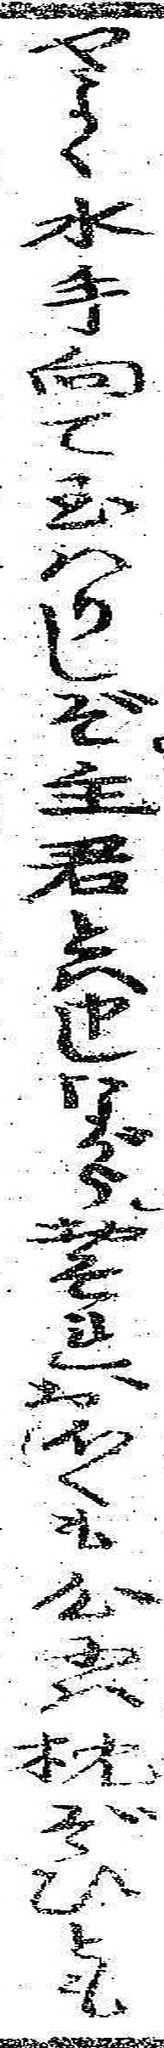やよく水手向て玉はりしぞ。主君とは申しながら。おそれおほくも心には。枕ぞひとも
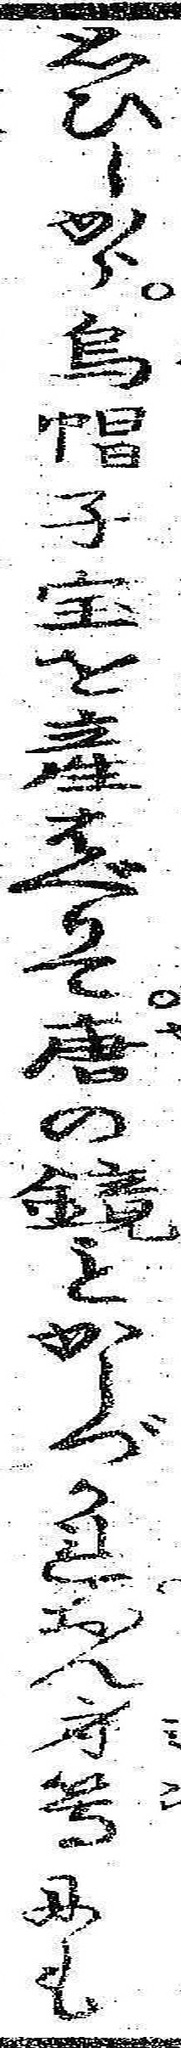思ひしから。烏帽子宝を産はべりて。唐の鏡とかしづかれ。おん身等にも
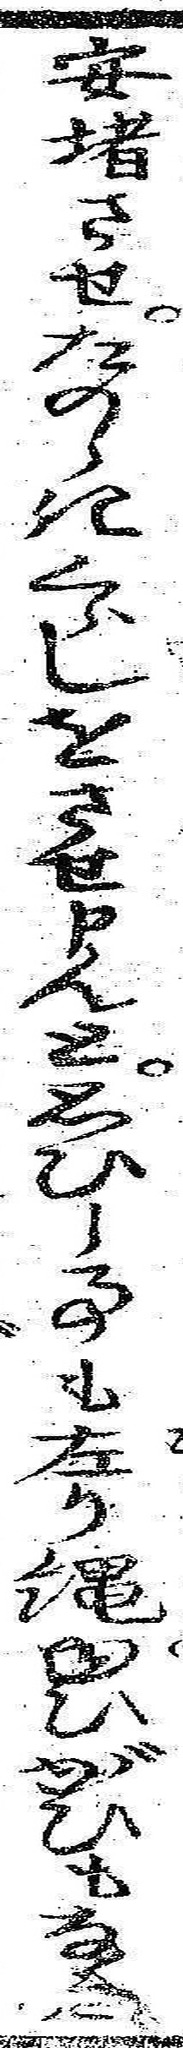安堵させ。たのしきくらしをさせ申んと。思ひし事も左り縄。ゆひがひもなき
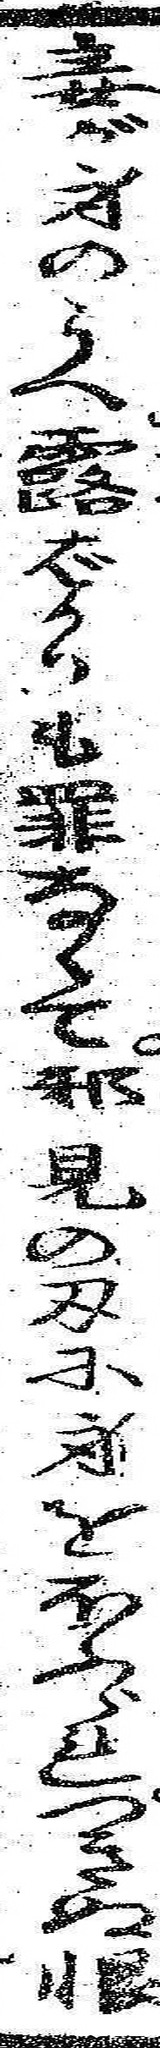妾が身のうへ。露ばかりも罪なくて。邪見の刃に身をほふられ。つきぬ恨
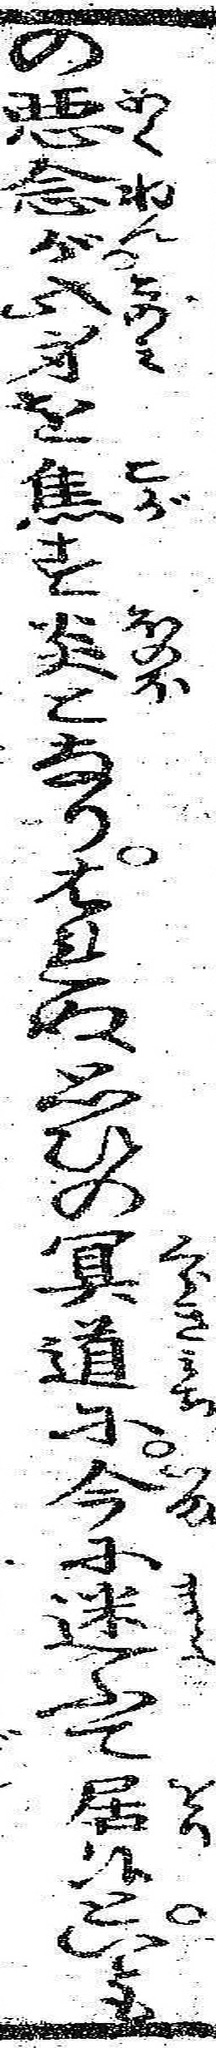の悪念が。此身を焦す炎となり。はれぬ思ひの冥道に。今に迷ふて居候と。いとも
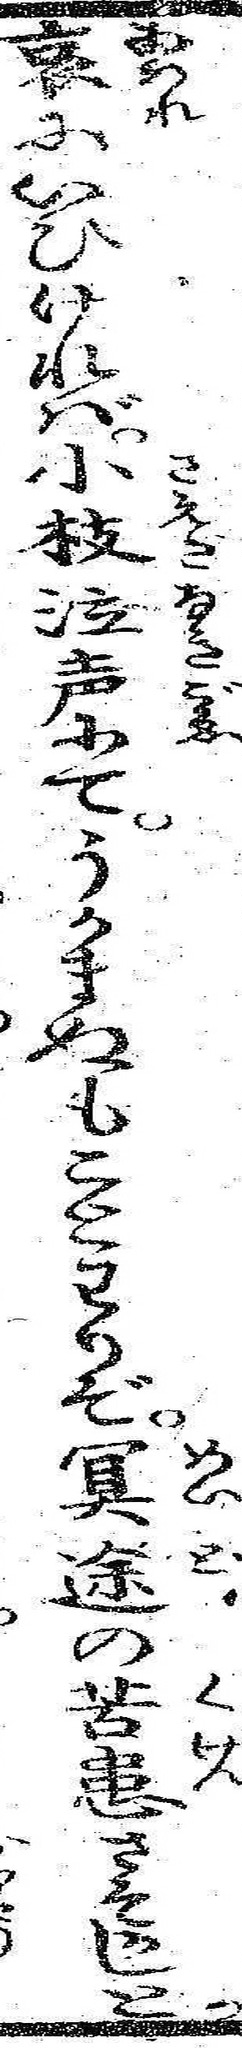哀にいひければ。小枝泣声にて。うかまぬもことわりぞ。冥途の苦患さそかしと。
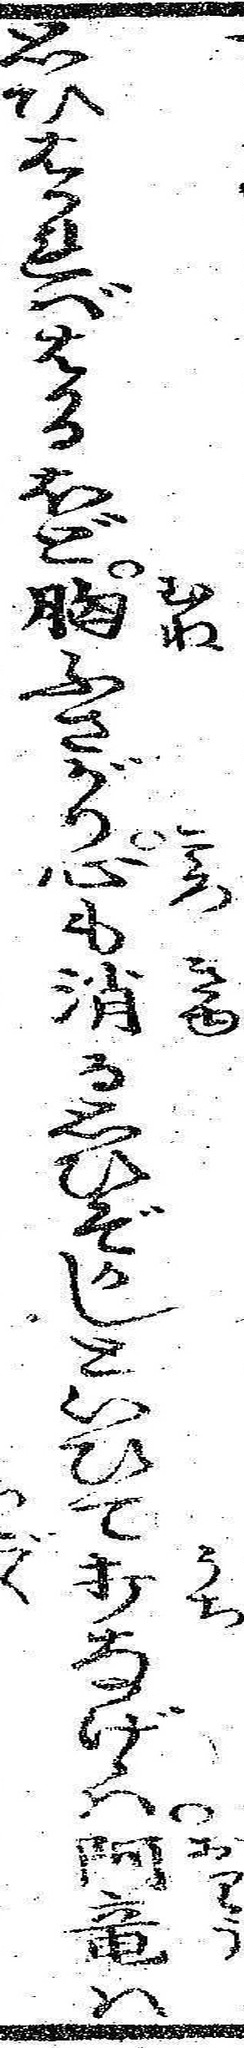思ひはかればはかるほど。胸ふさがり。心も消る思ひぞかしといひて打なげゝは。阿竜は
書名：昔話稲妻表紙
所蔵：国文学研究資料館
